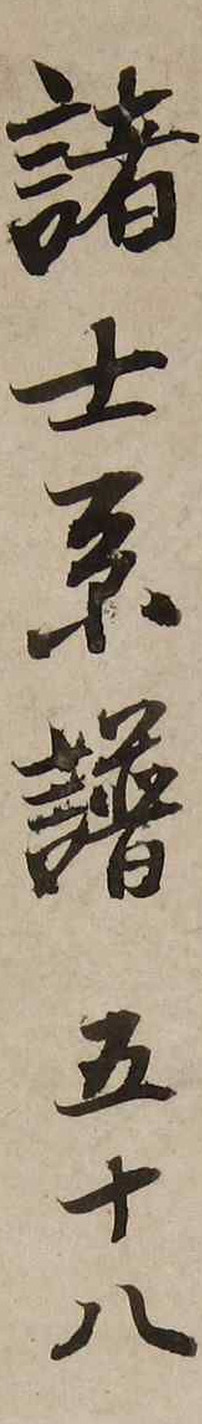諸士系譜五十八

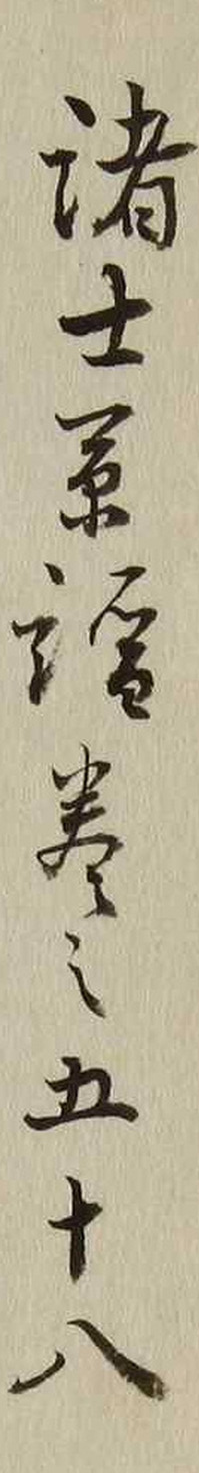諸士系譜巻之五十八
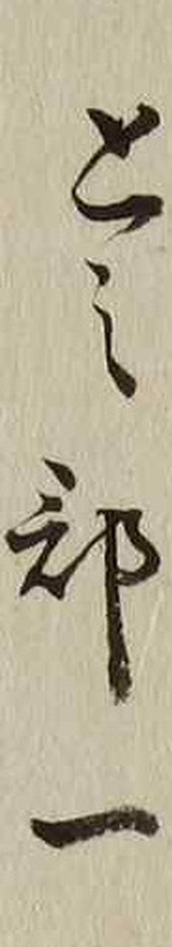と之部一
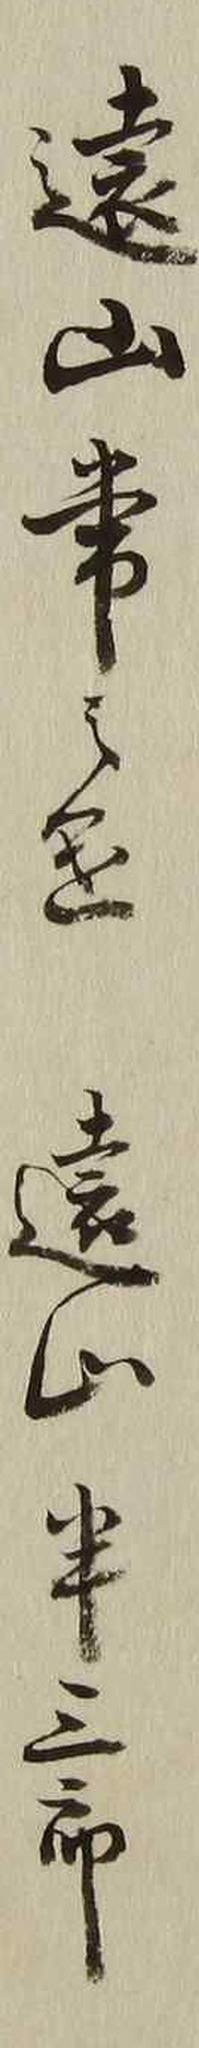遠山常之進遠山半三郎

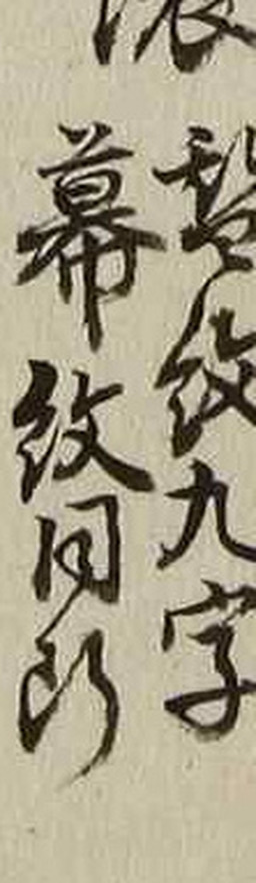幕紋同断
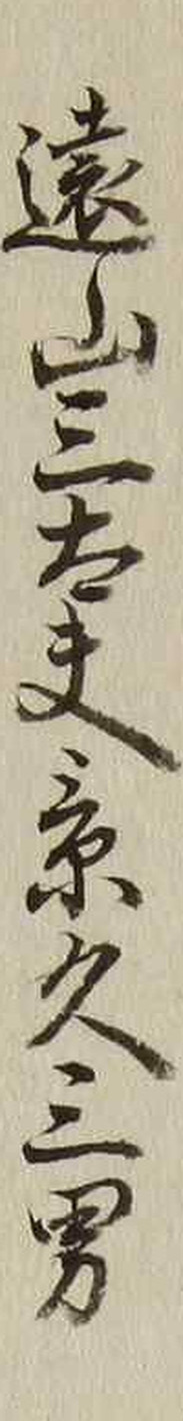遠山三太夫景久三男
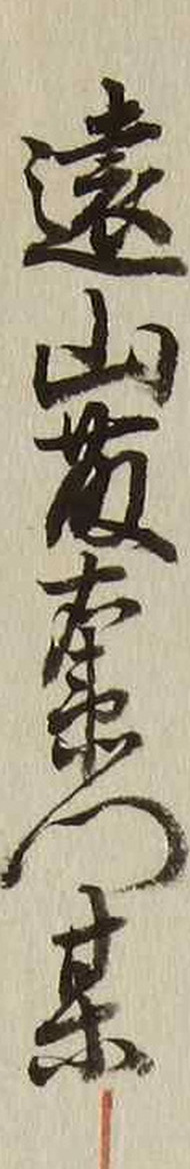遠山藤右衛門某
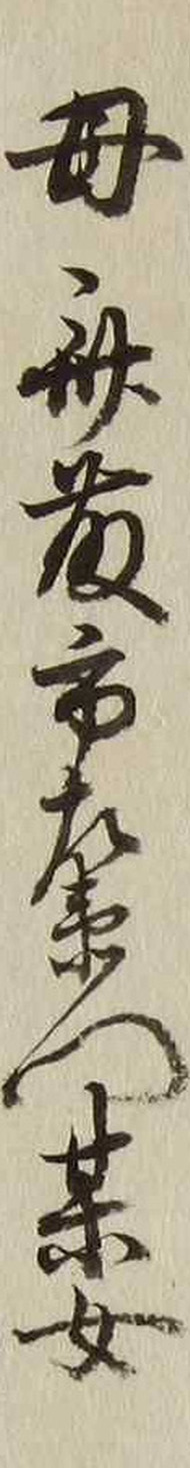母斎藤市左衛門某女
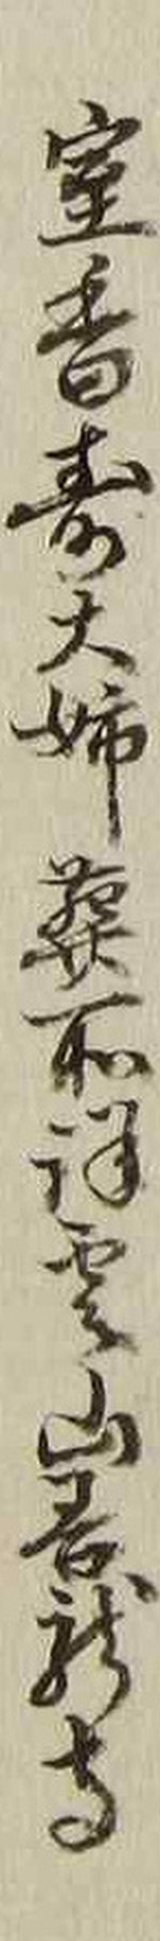室香寿大姉葬所祥雲山善龍寺
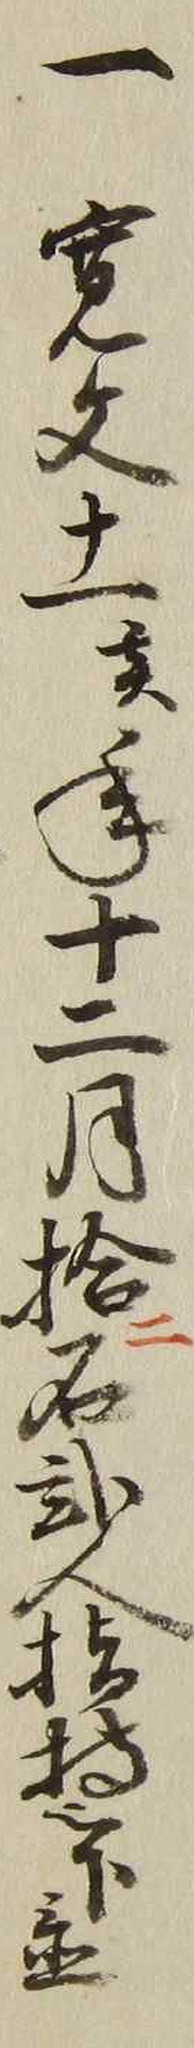一寛文十一亥年十二月拾二石弐人扶持被下置
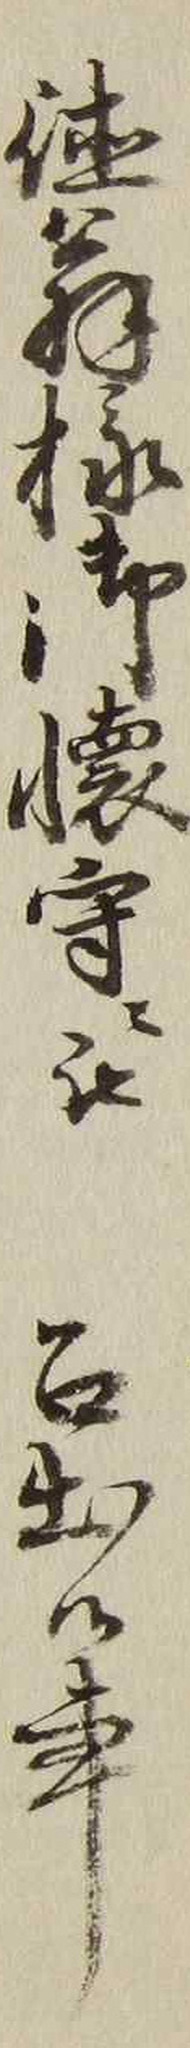徳翁様御懐守ニ被召出候事
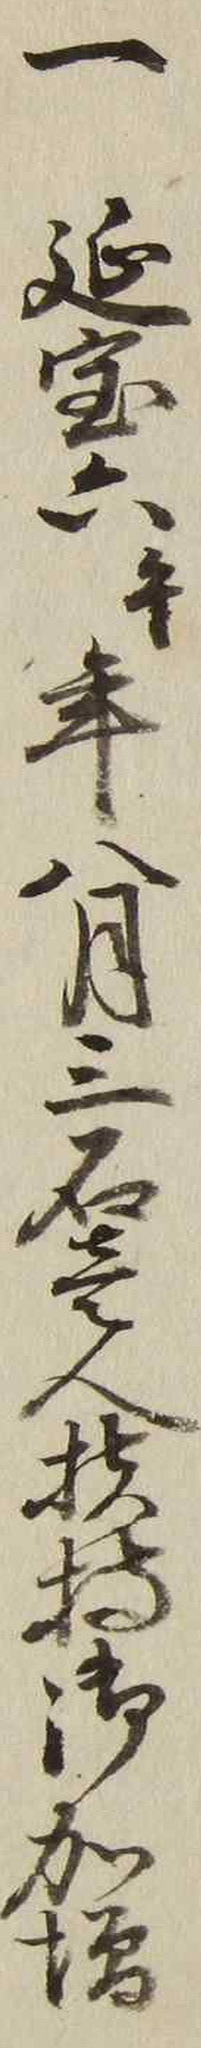一延宝六午年八月三石壱人扶持御加増
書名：諸士系譜　巻之58　と之部1
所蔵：会津若松市立会津図書館
